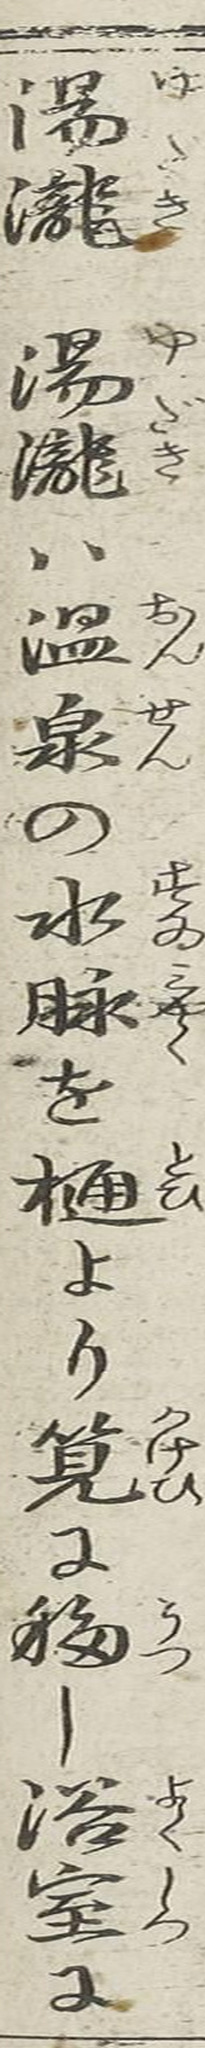湯瀧湯瀧は温泉の水脈を樋より筧に移し浴室に
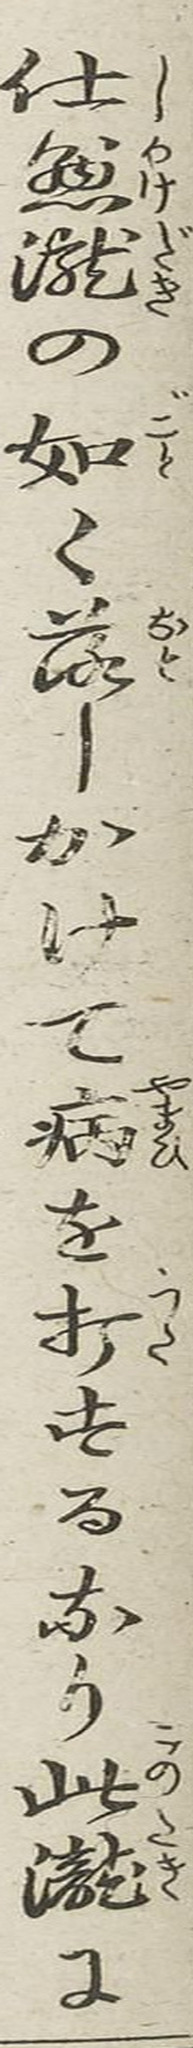仕懸瀧の如く落しかけて病を打するなり此瀧に
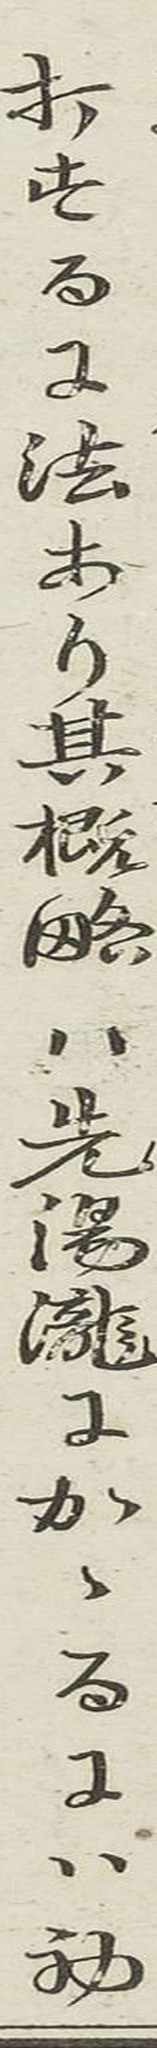打するに法あり其概略は先湯瀧にかゝるには初
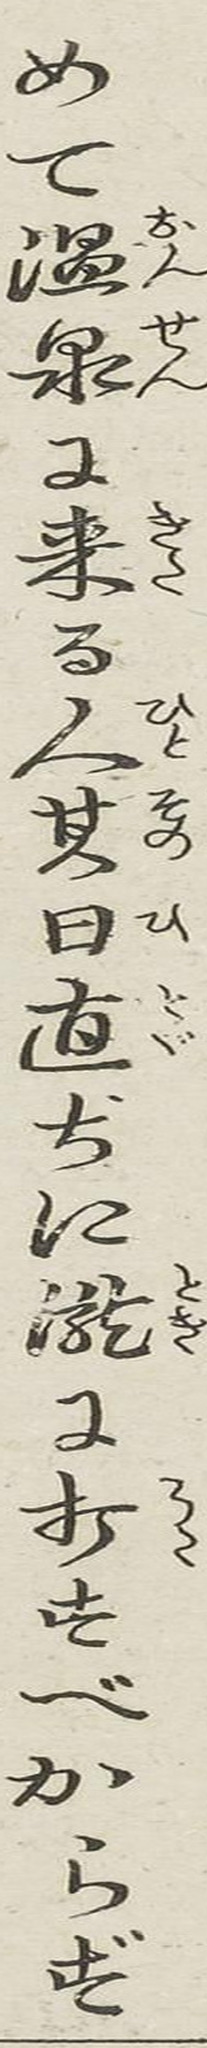めて温泉に来る人其日直ちに瀧に打すべからず
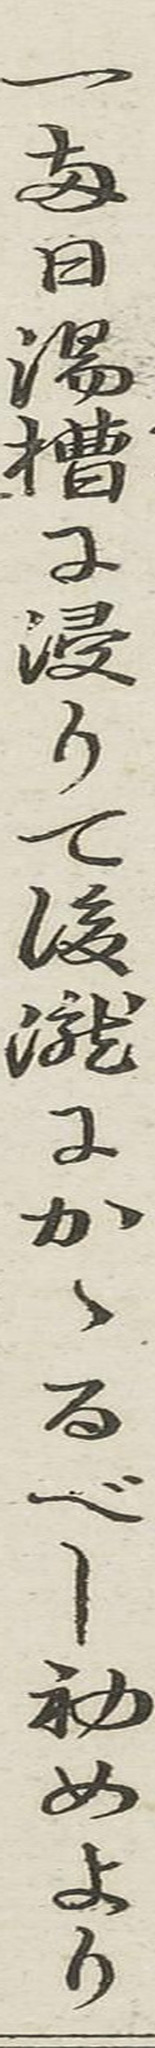一留日湯槽に浸りて後瀧にかゝるべし初めより
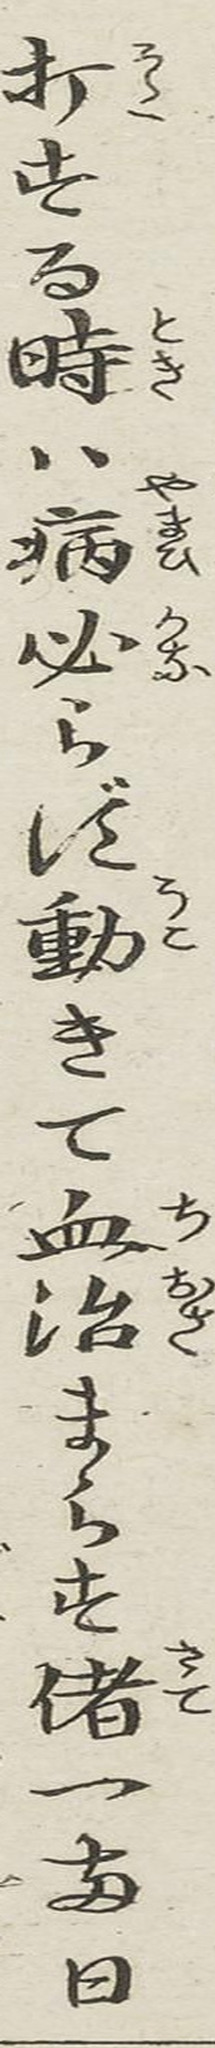打する時は病必らず動きて血冶まらす偖一留日
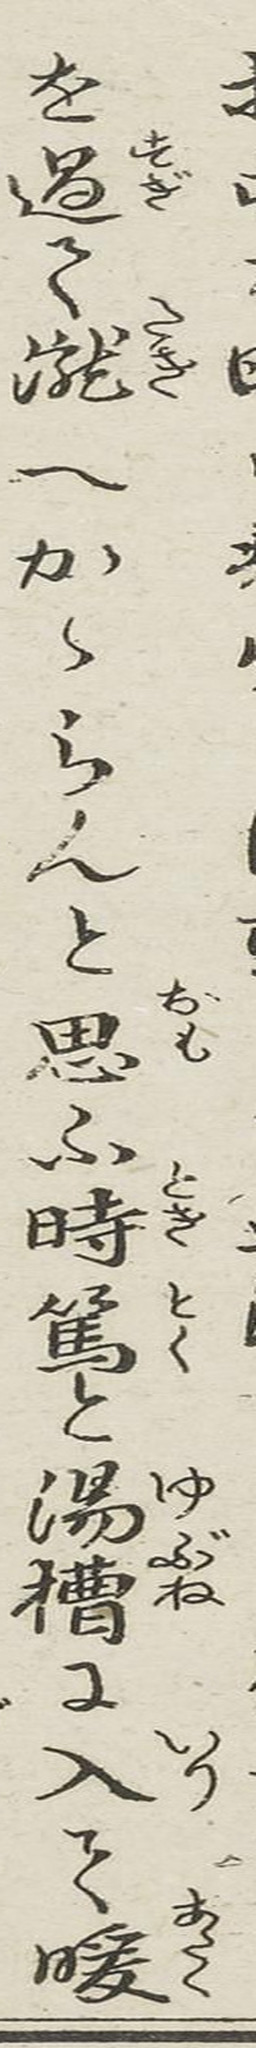を過て瀧へかゝらんと思ふ時篤と湯槽に入て暖
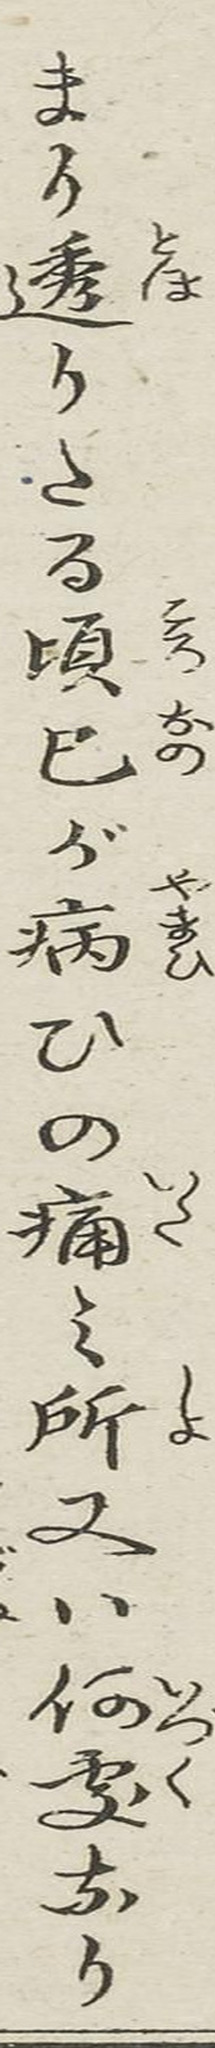まり透りたる頃己が病の痛み所又は何處なり
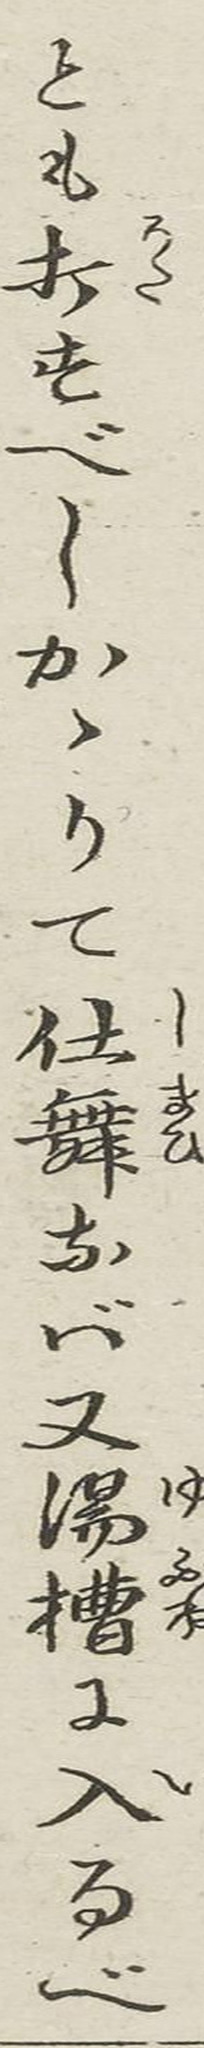とも打すべくかゝりて仕舞なば又湯槽に入るべ
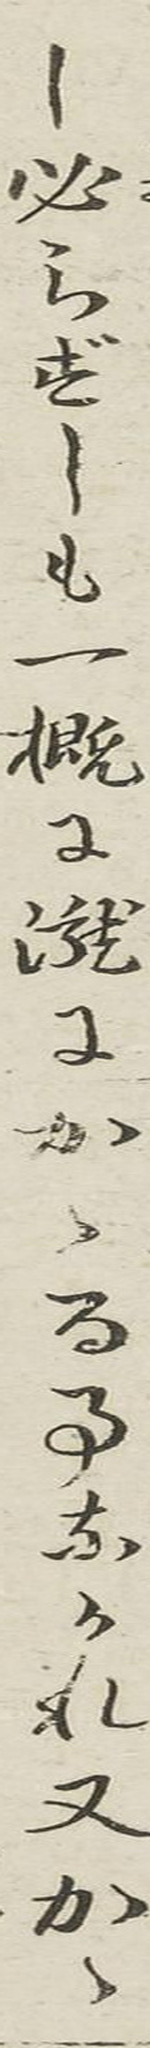し必らずしも一概に瀧にかゝる事なかれ又かゝ
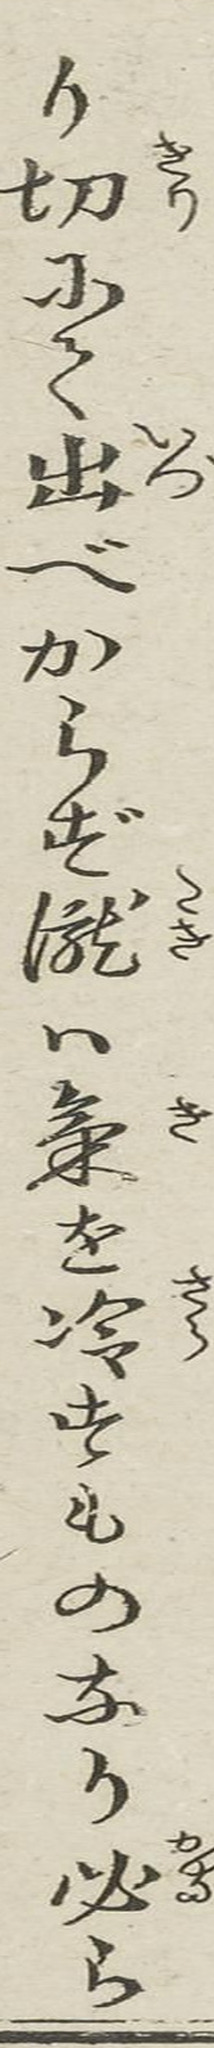り切にて出べからず瀧は氣を冷すものなり必ら

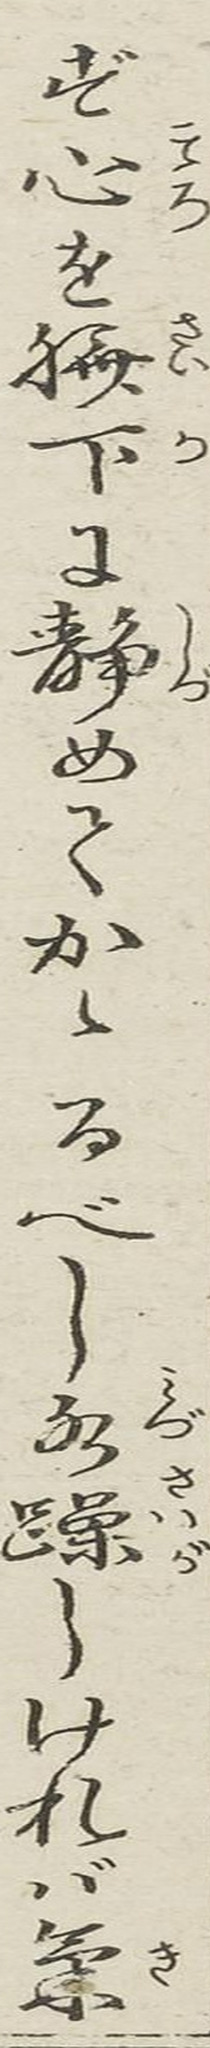ず心を臍下に静めてかゝるべし水躁しければ氣
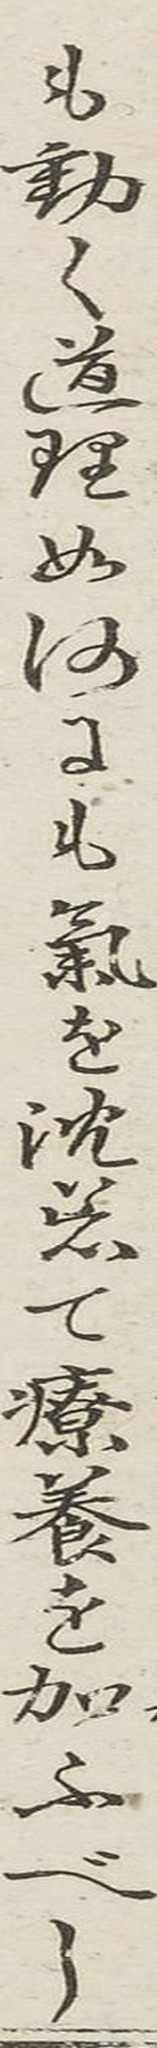も動く道理如何にも氣を沈着て療養を加ふべし
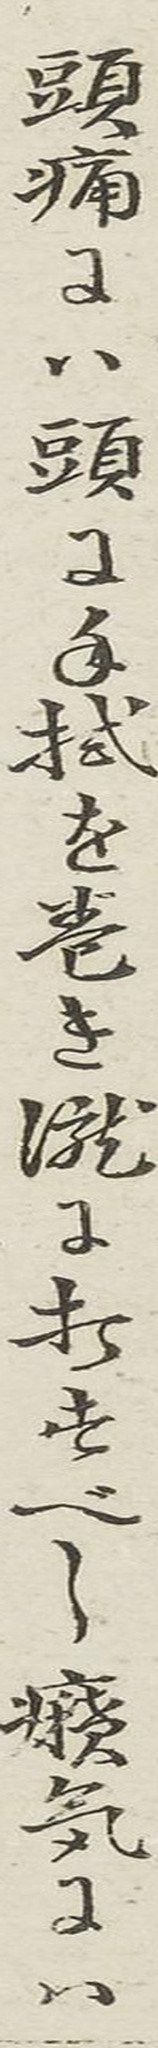頭痛には頭に手拭を巻き瀧に打すべし癪気には
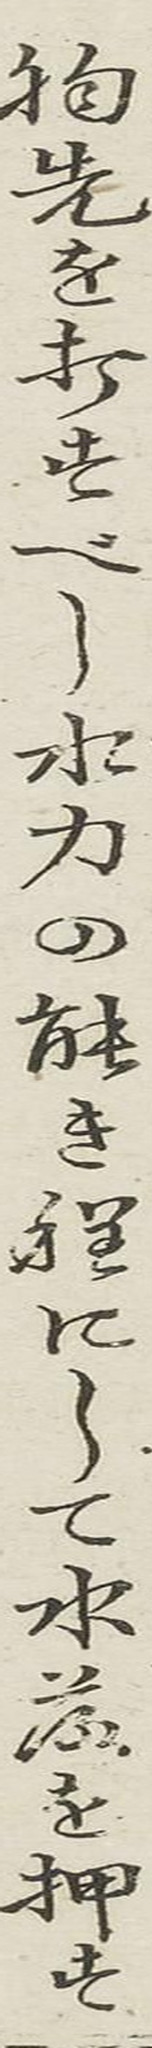胸先を打すべし水力の能き程にして水落を押す
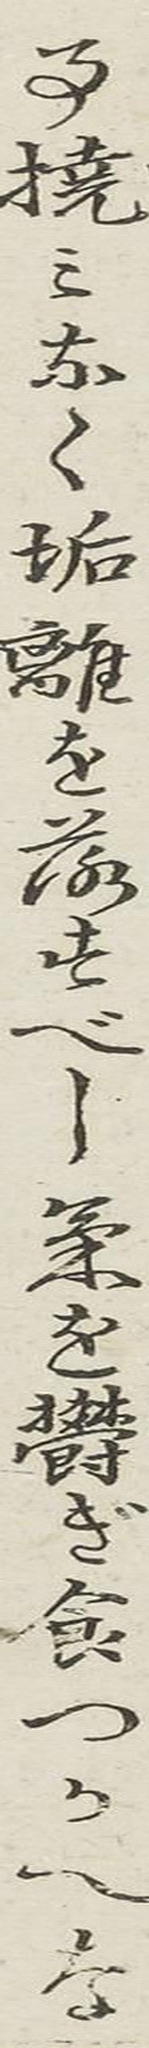事撓みなく垢離を落すべし氣を欝ぎ食つかへな
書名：箱根温泉誌　全
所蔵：東京大学地震研究所図書室 Earthquake Research Institute Library, The University of Tokyo, JAPAN
